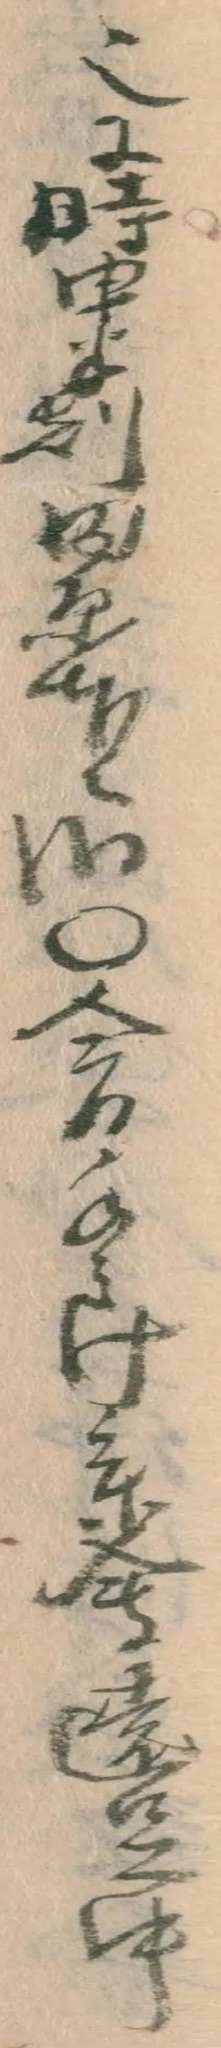也于時申半刻田原本ニ泊○今日手之汁参會遠足中
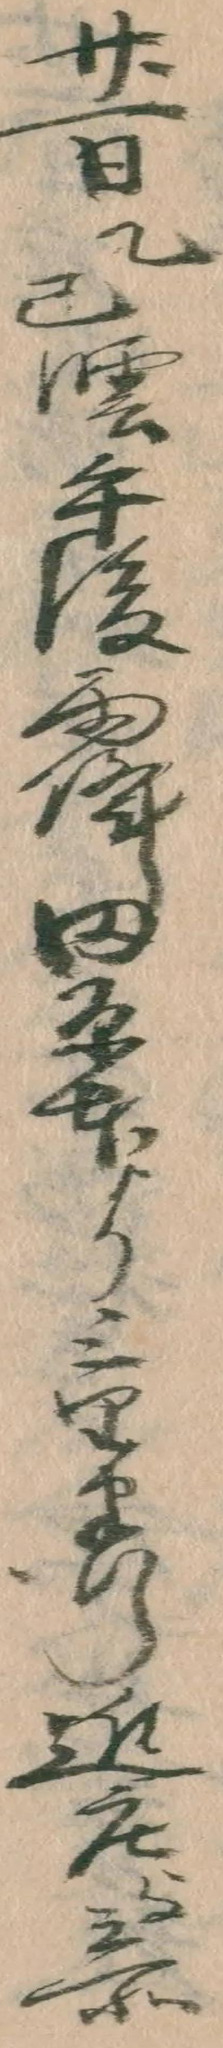廿一日乙巳曇午後雨降田原本より三里半行近庄と云所
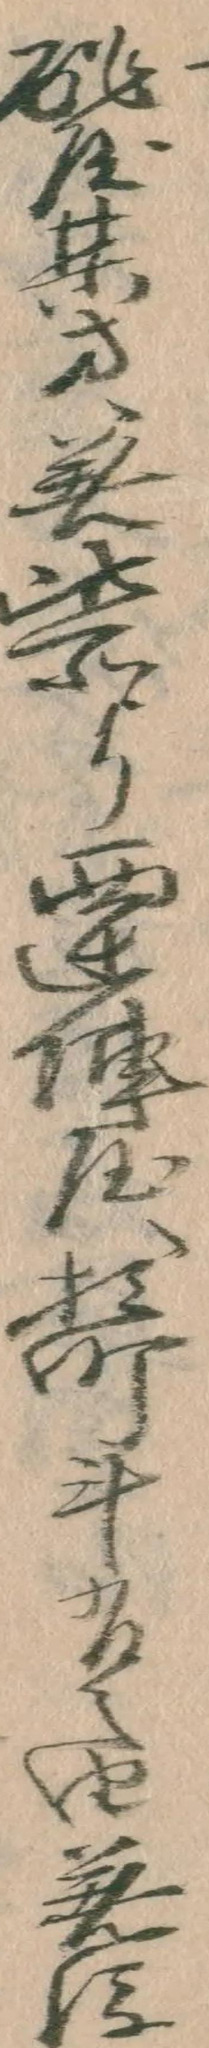酢屋某方へ着此所より西辻陣屋へ相町斗有之由着袴
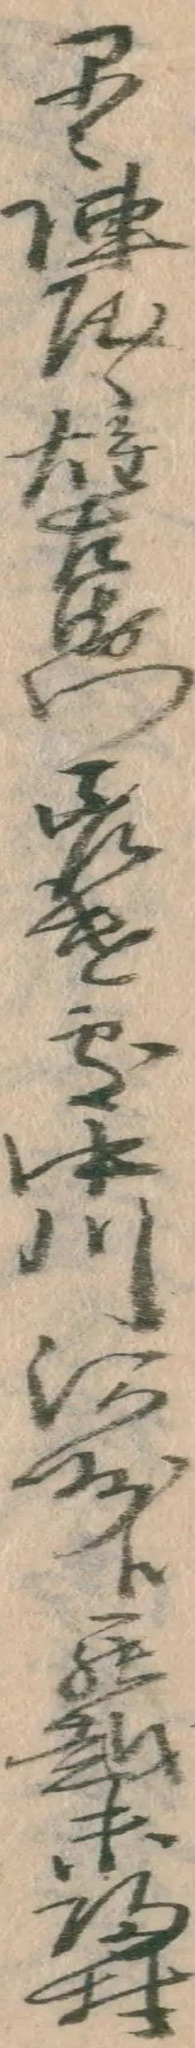早々陣屋へ雄左衛門差遣處中川河多え罷越未帰村
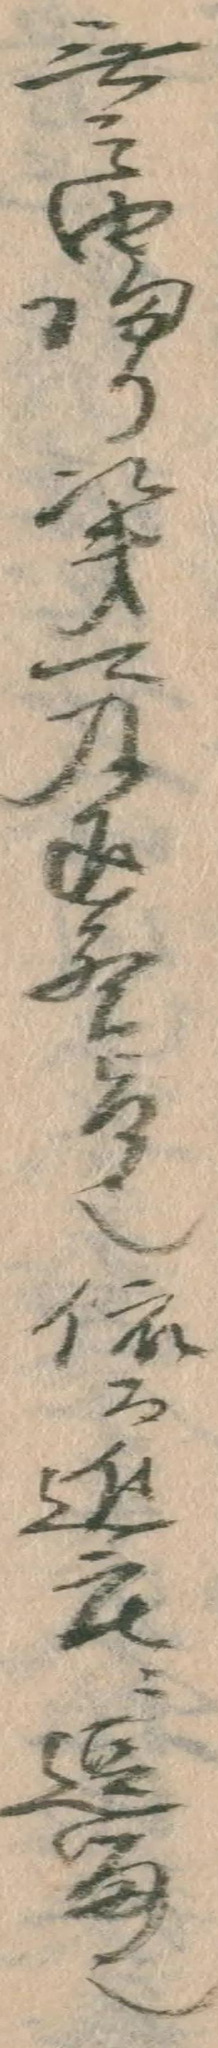無之由帰り次第可及返答旨也依而近庄に逗留也
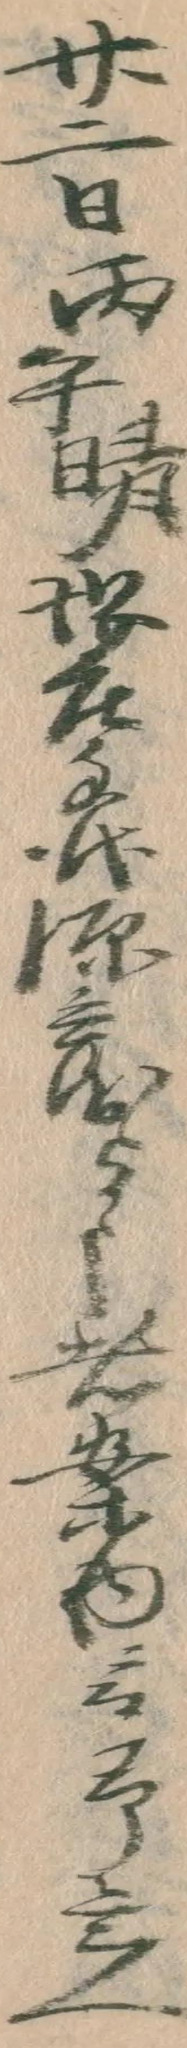廿二日丙午晴堺庄手代源蔵と申者案内ニ而予壱人
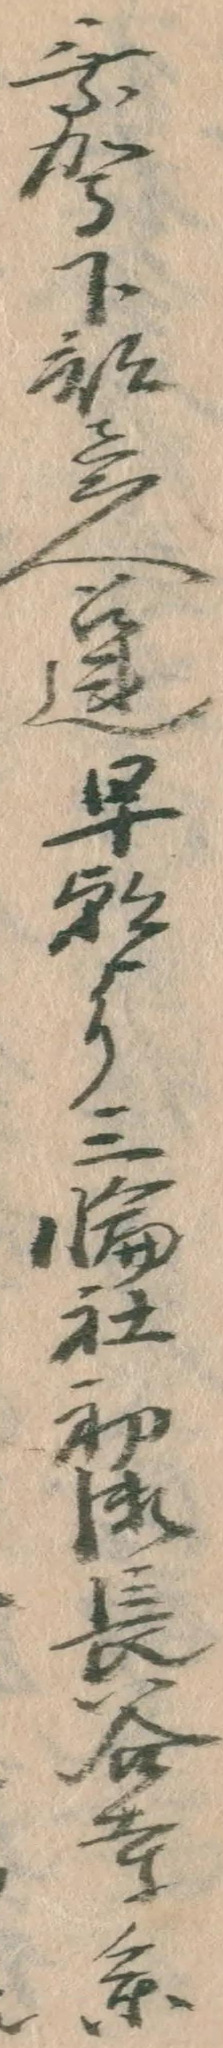乗駕下部壱人召連早朝より三輪社初御長谷寺参
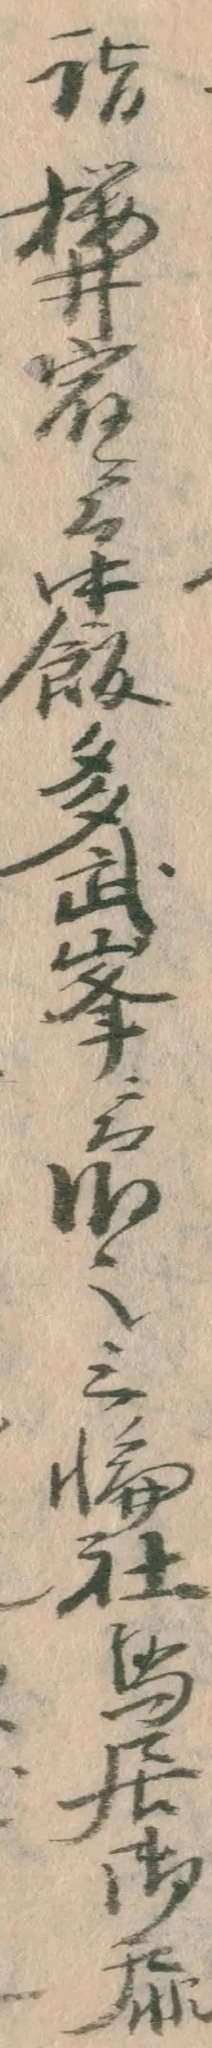詣桜井宿ニ而中飯多武峯ニ而明之三輪社鳥居御扉
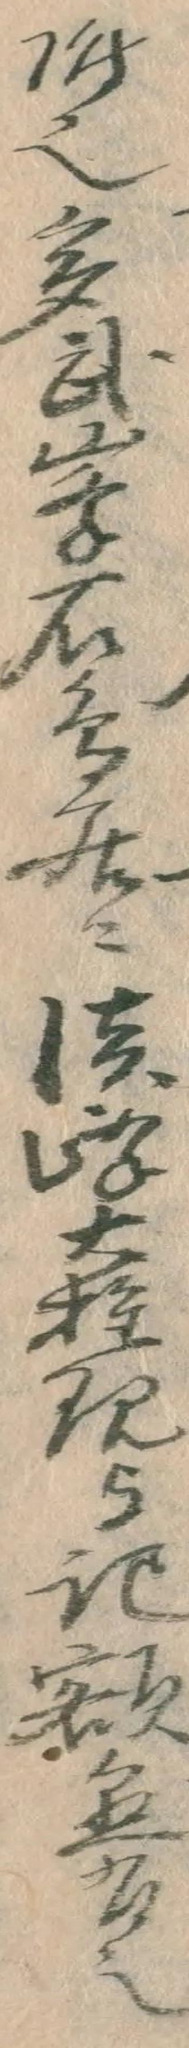附也多武峯石鳥居ニニ淡路大権現と記額懸也
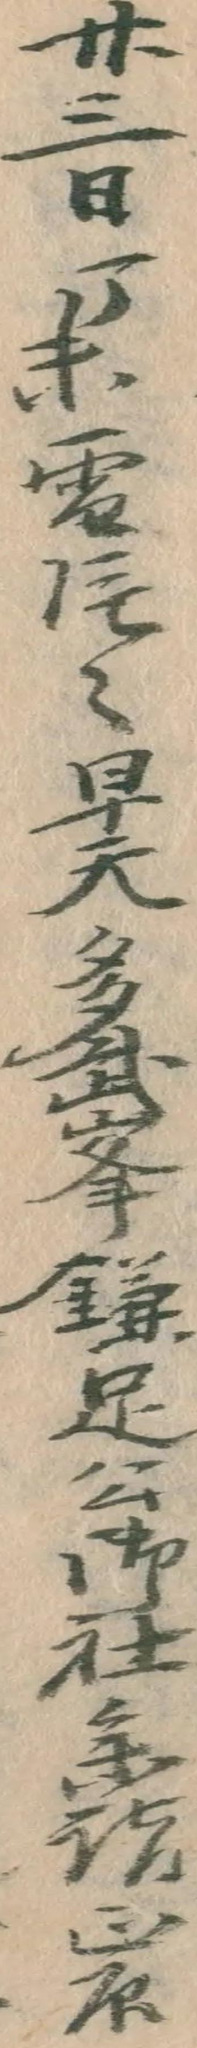廿三日丁未雪強々早天多武峯鎌足公御社参詣正辰
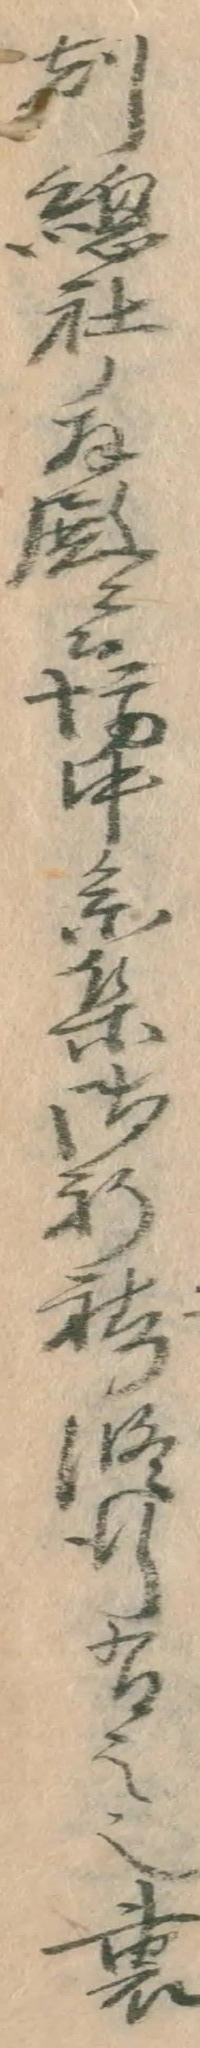削總社之拝殿ニ而坊中参集御祈祷修行有之也裏

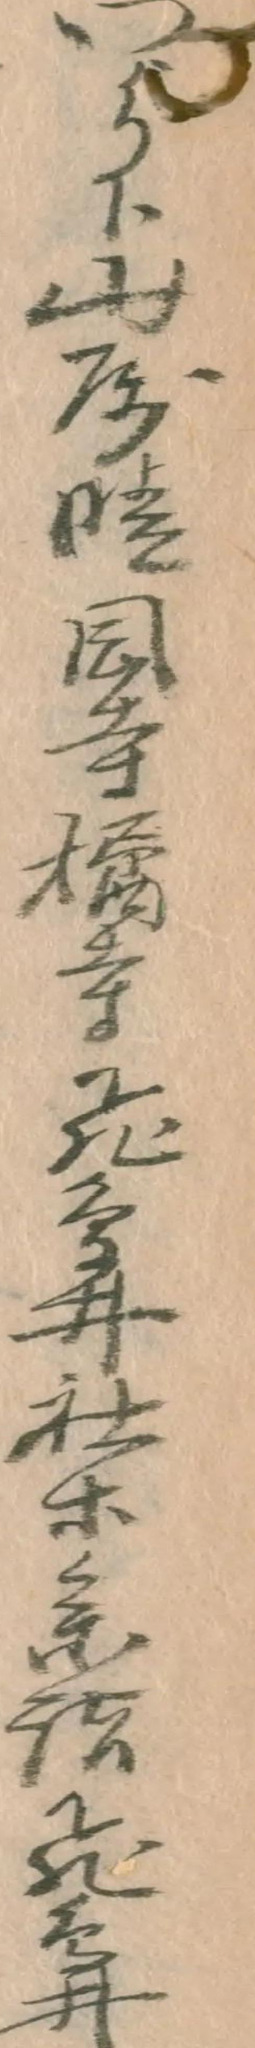門より下山属晴岡寺橘寺飛鳥井社等参詣飛鳥井
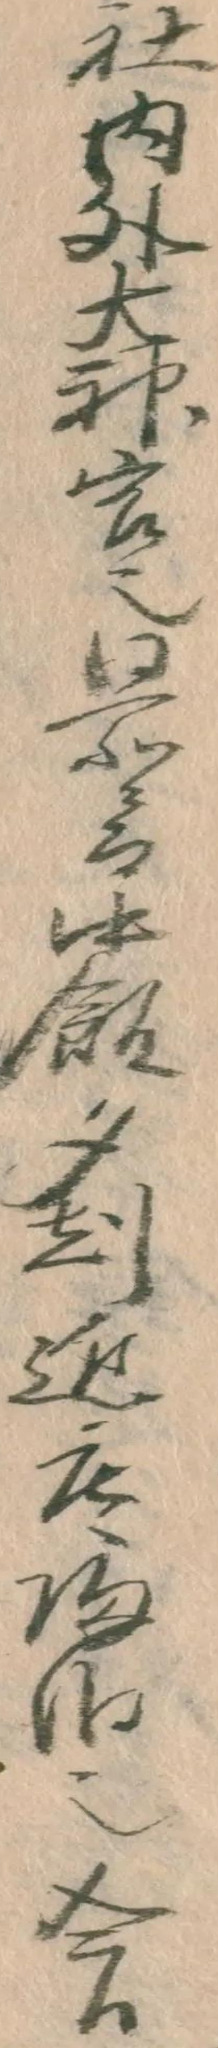社内外大神宮也同所ニ而中飯夕刻近庄へ帰泊也今日
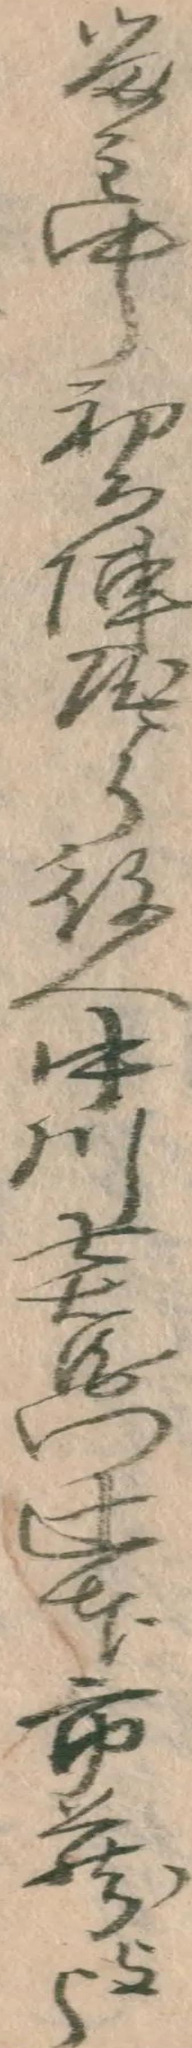留主中初而陣屋より役人中川七右衛門辻本市蔵と申
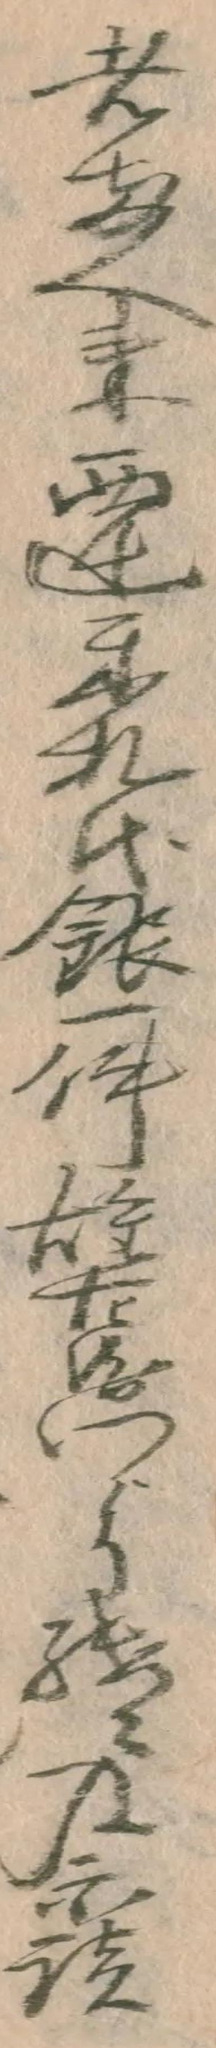者両人来西辻米札代銀一件雄左衛門より能々及示談
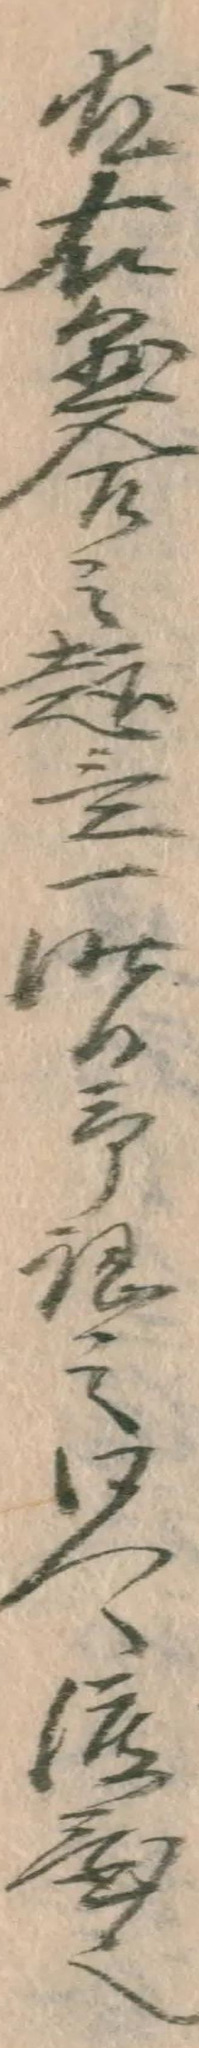尤右懸合之趣意一昨日予認之同人へ渡置也
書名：賀茂社記録. 第67冊
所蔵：国立国会図書館 National Diet Library, JAPAN
